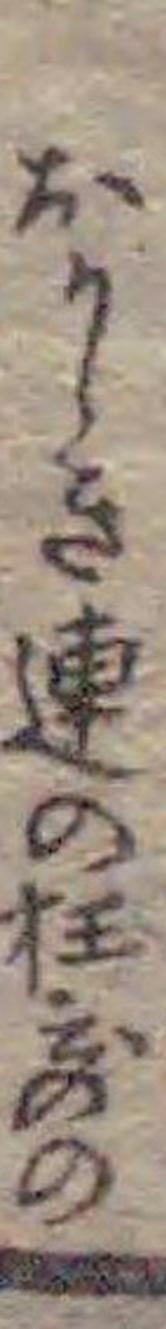おかしき連の狂歌の
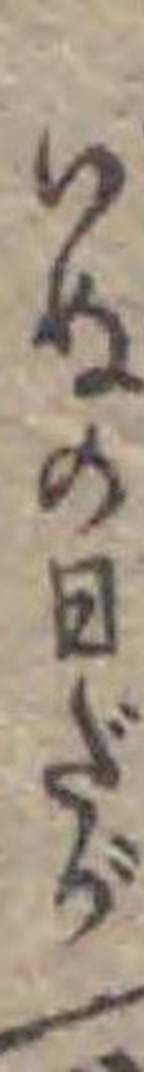いぬの日だが
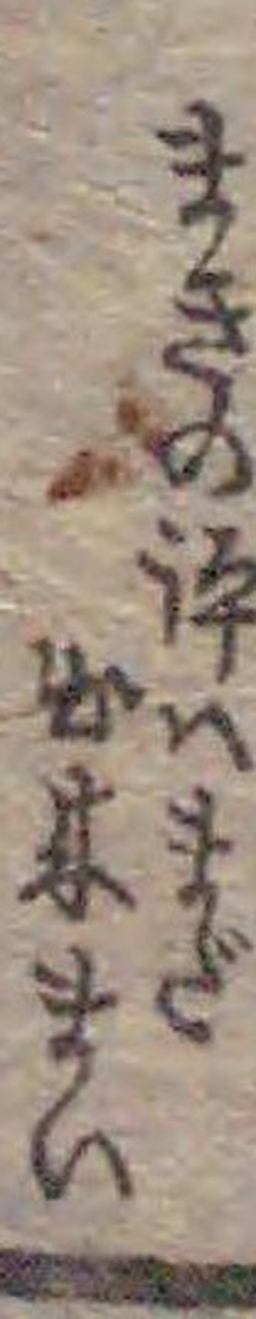出来まい
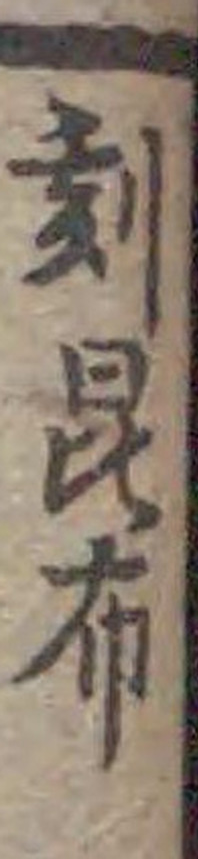刻昆布
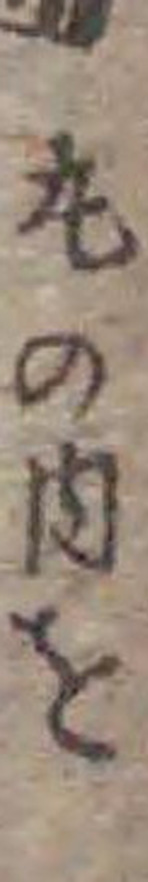丸の内を
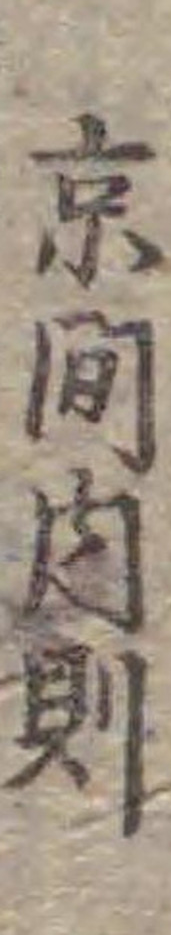京間内則
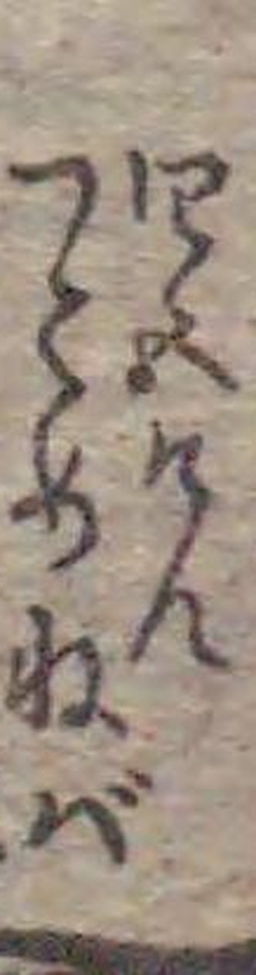つとめねば
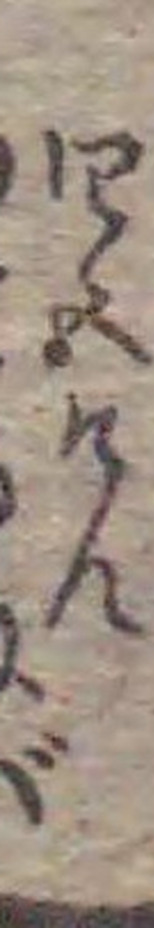四五けん
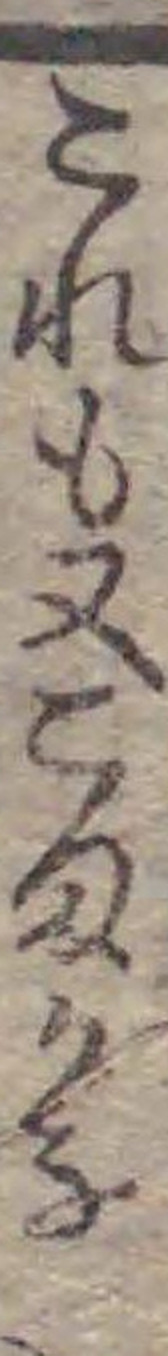これも又こまかな
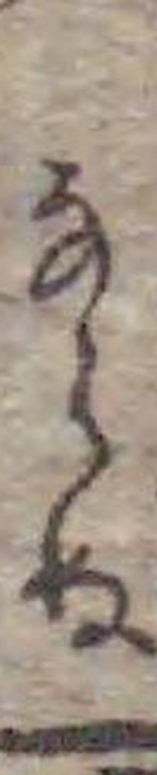ならぬ
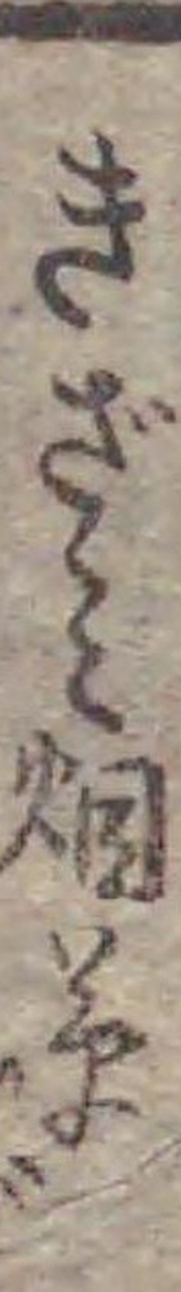きざみ煙草
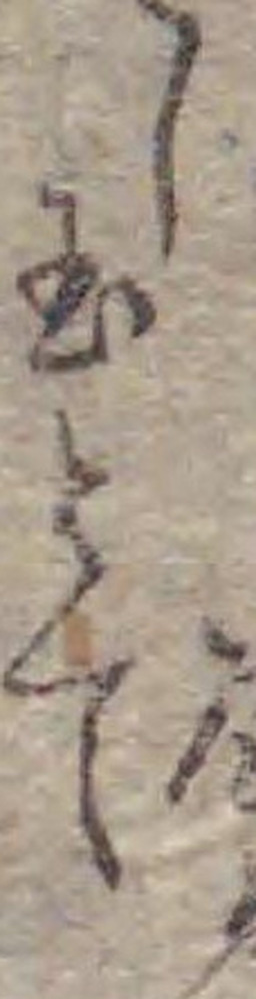玉とて
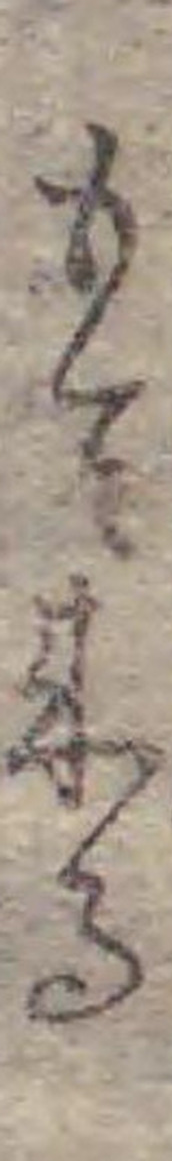もて来る
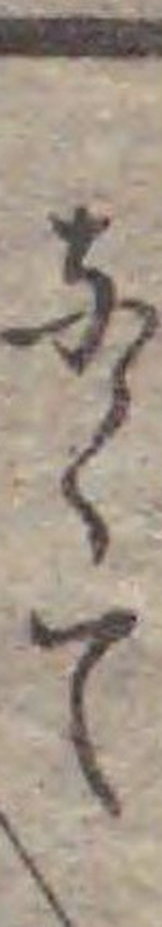なくて
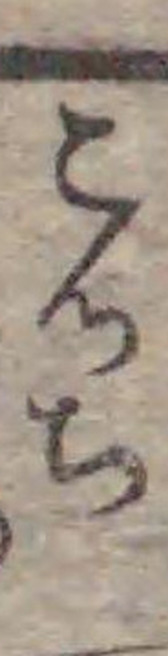こつち

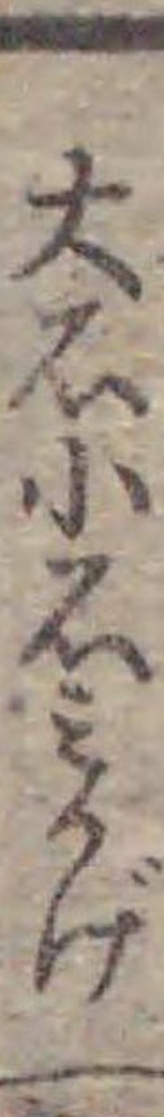大石小石みかげ
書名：年始御礼帳 : 3巻
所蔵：国立国会図書館 National Diet Library, JAPAN
